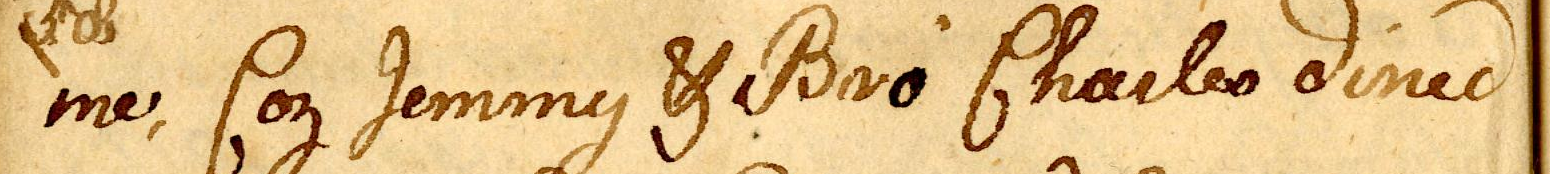me, Coz Jemmy & Bro' Charles dined
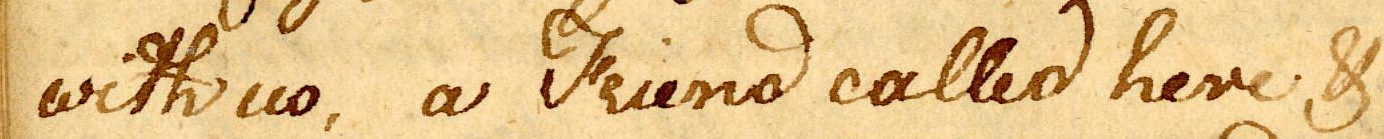with us, a Friend called here &
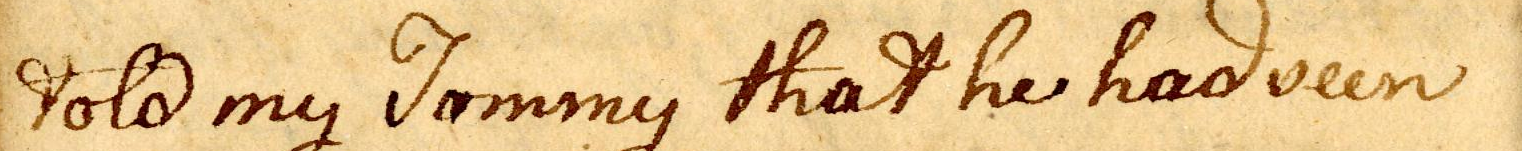told my Tommy that he had seen
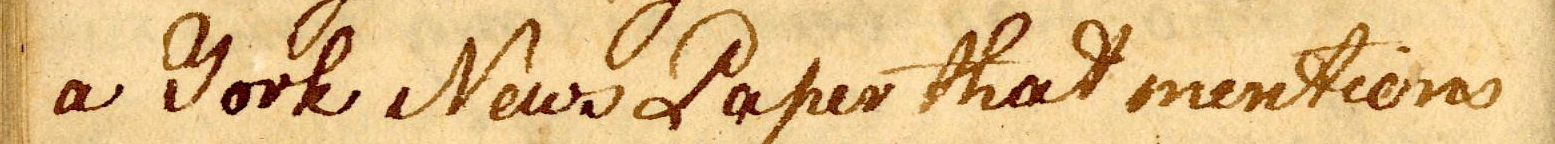a York News Paper that mentions
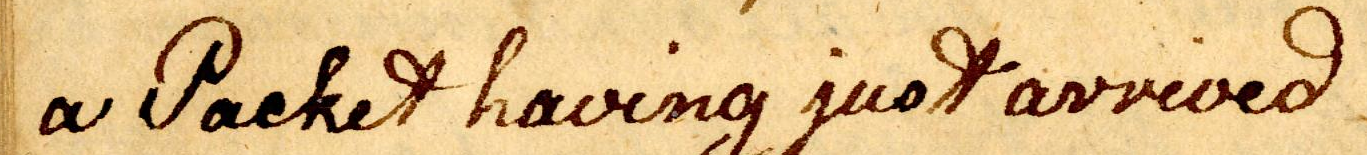a Packet having just arrived
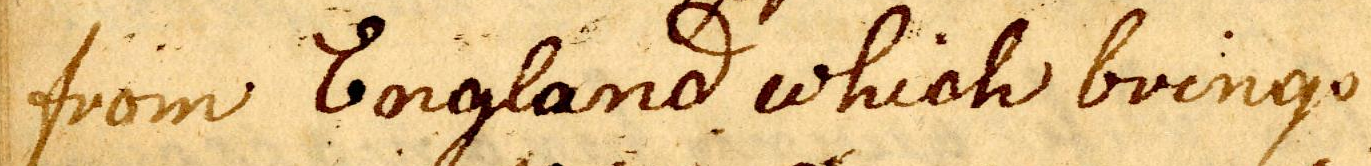from England which brings
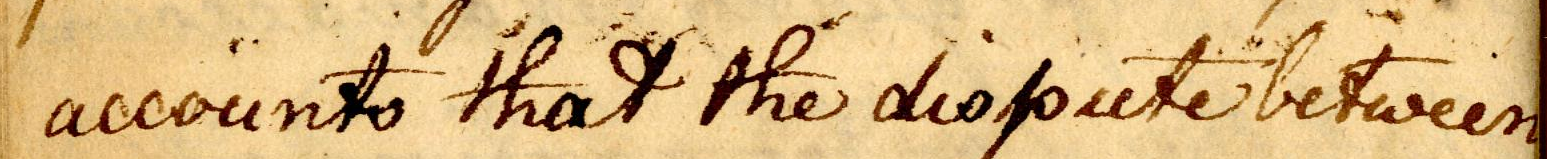accounts that the dispute between
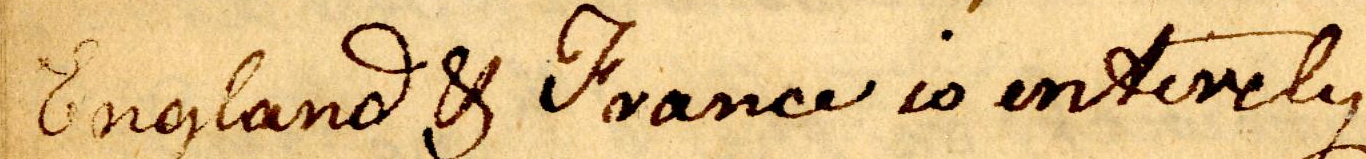England & France is entirely
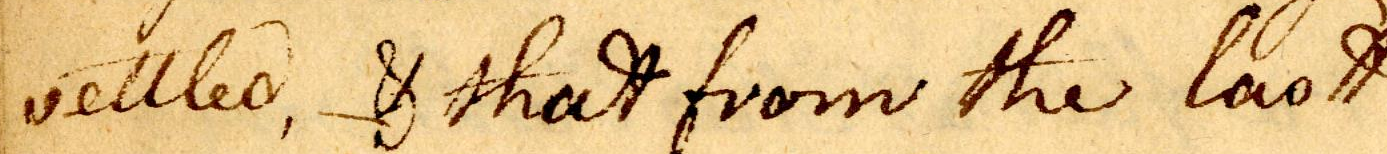settled, & that from the last
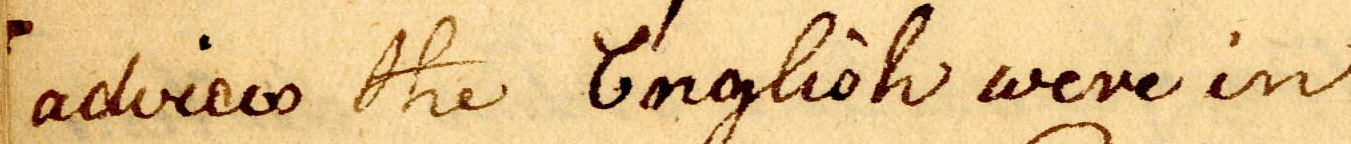advices the English were in
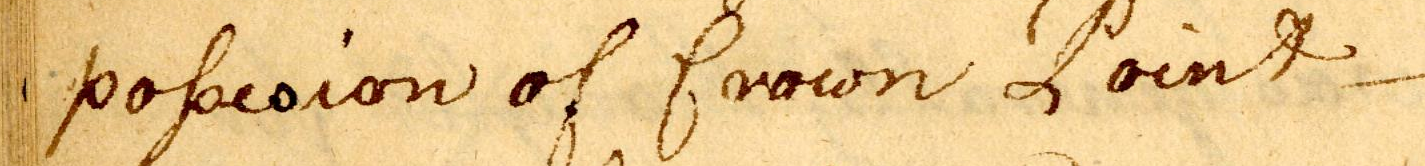possesion of Crown Point-
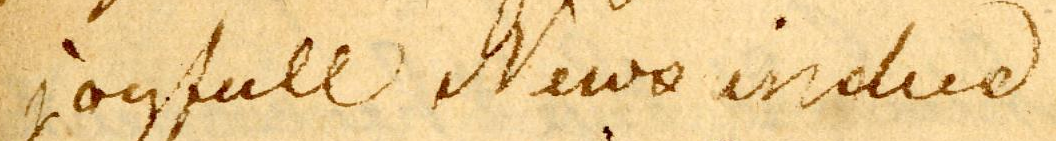joyfull News indeed -
